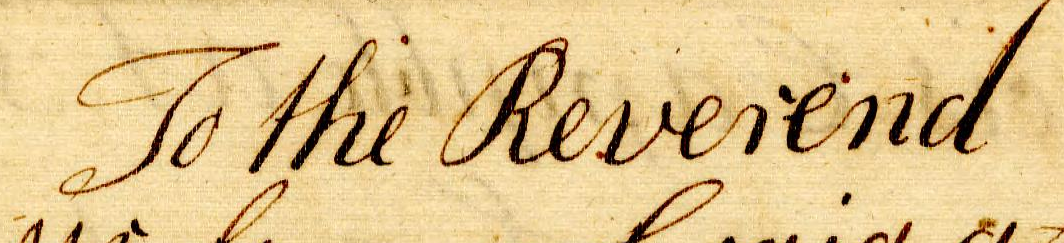To the Reverend
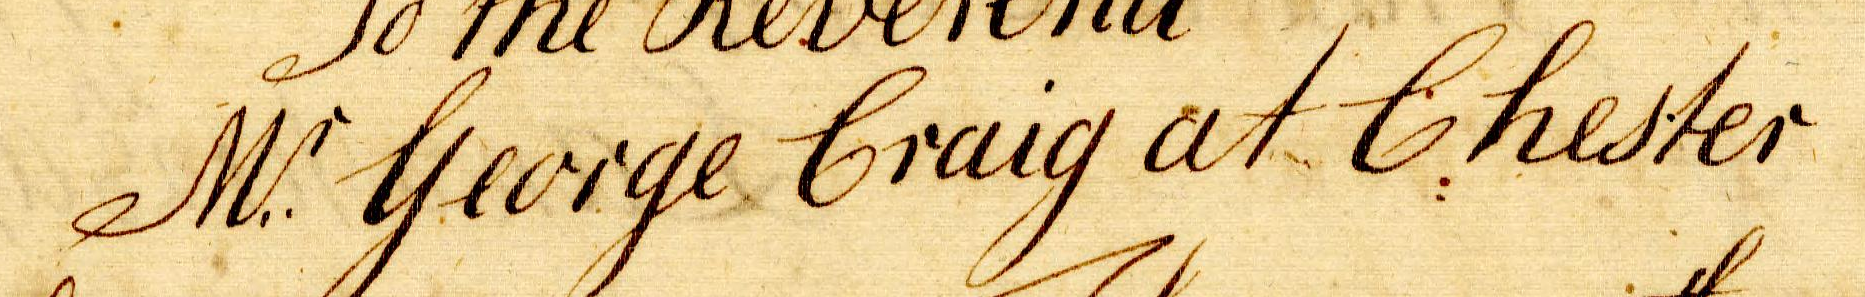M^r. George Craig at Chester
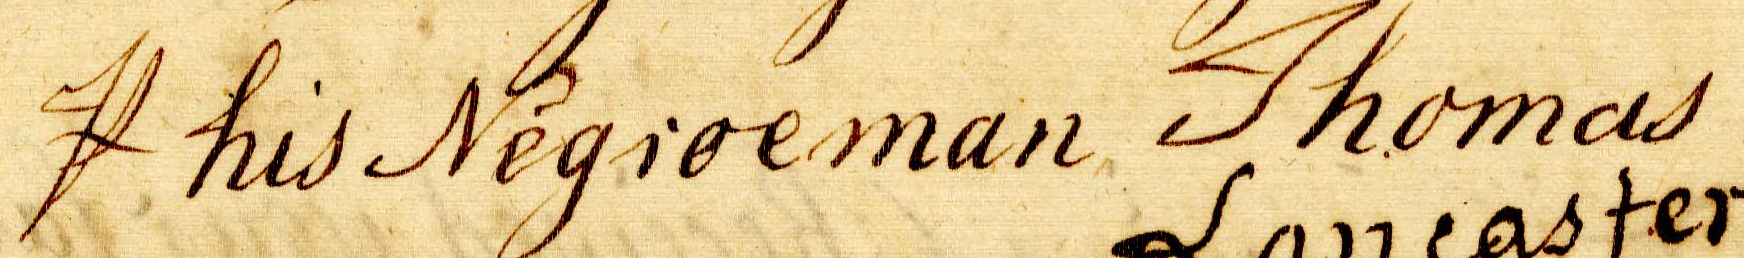per his Negroeman Thomas
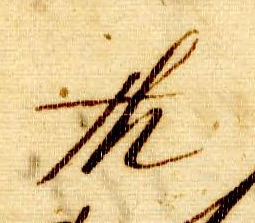th
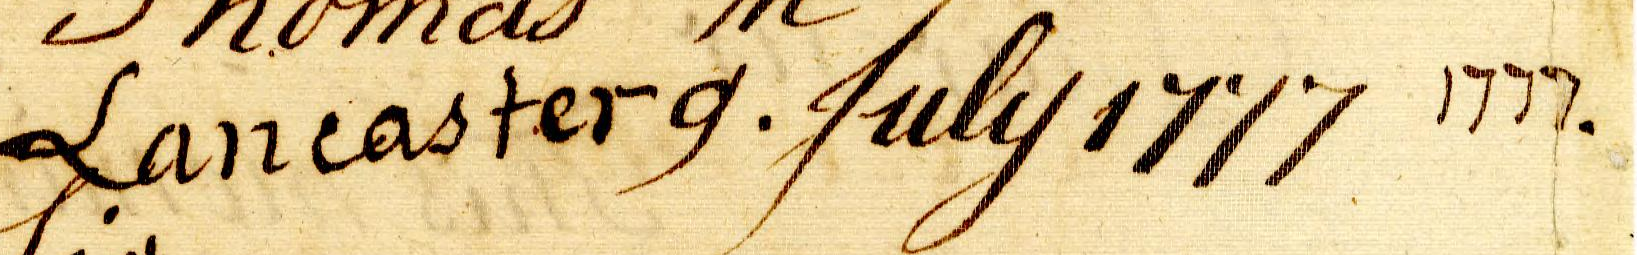Lancaster 9. July 1777 1777.
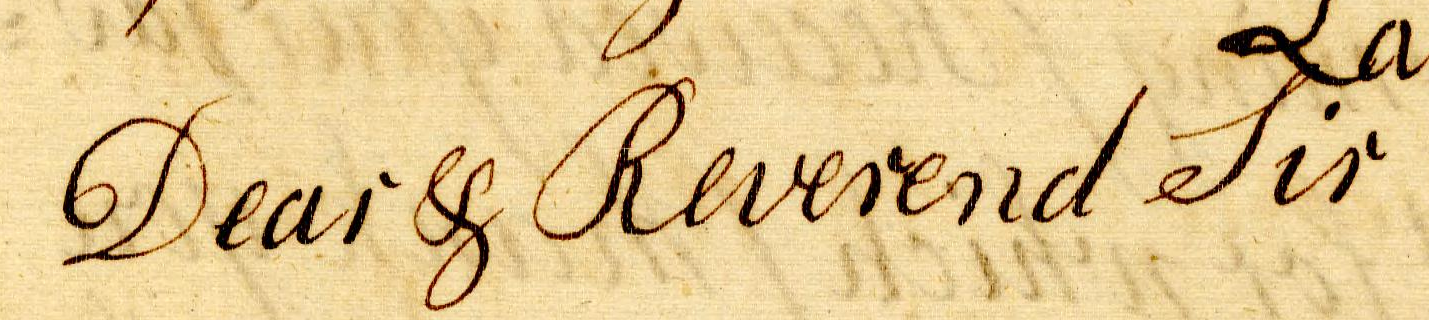Dear & Reverend Sir
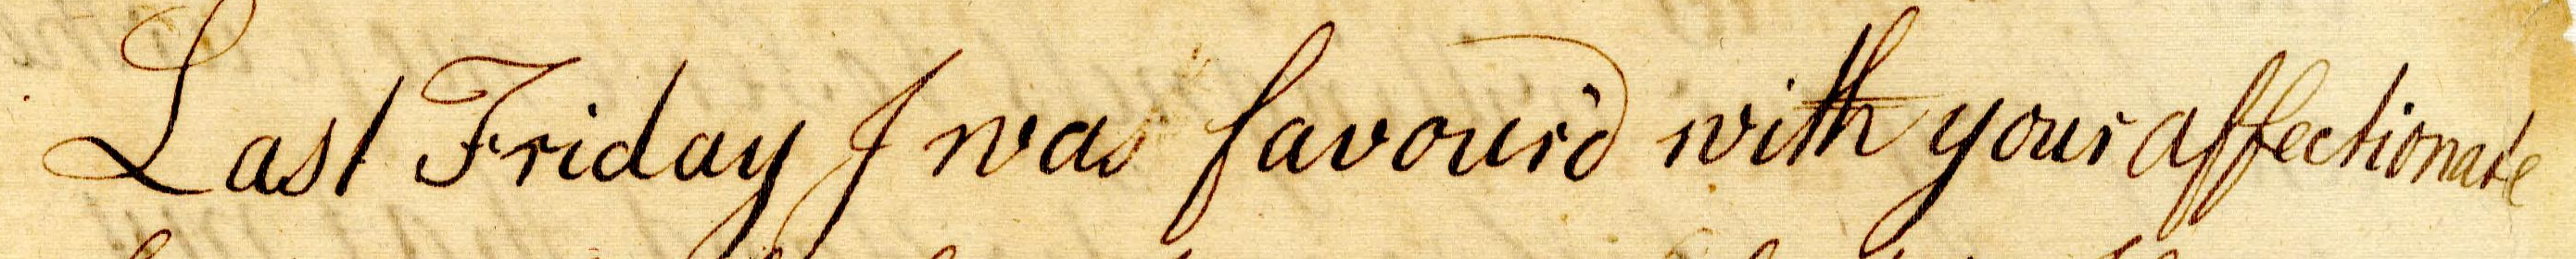Last Friday I was favour'd with your affectionate
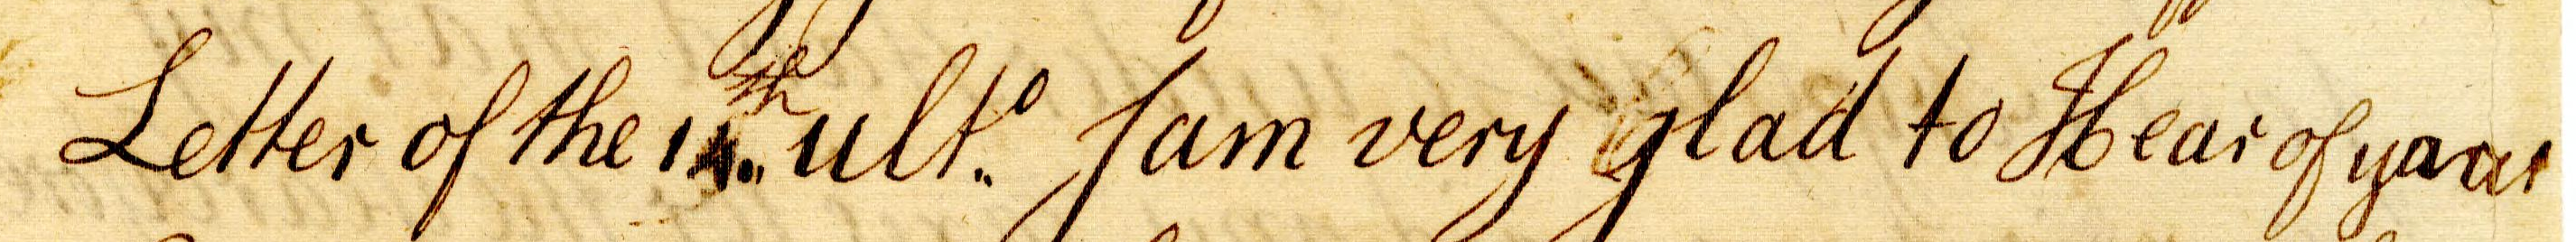Letter of the 14^th. ult^o. I am very glad to Hear of your
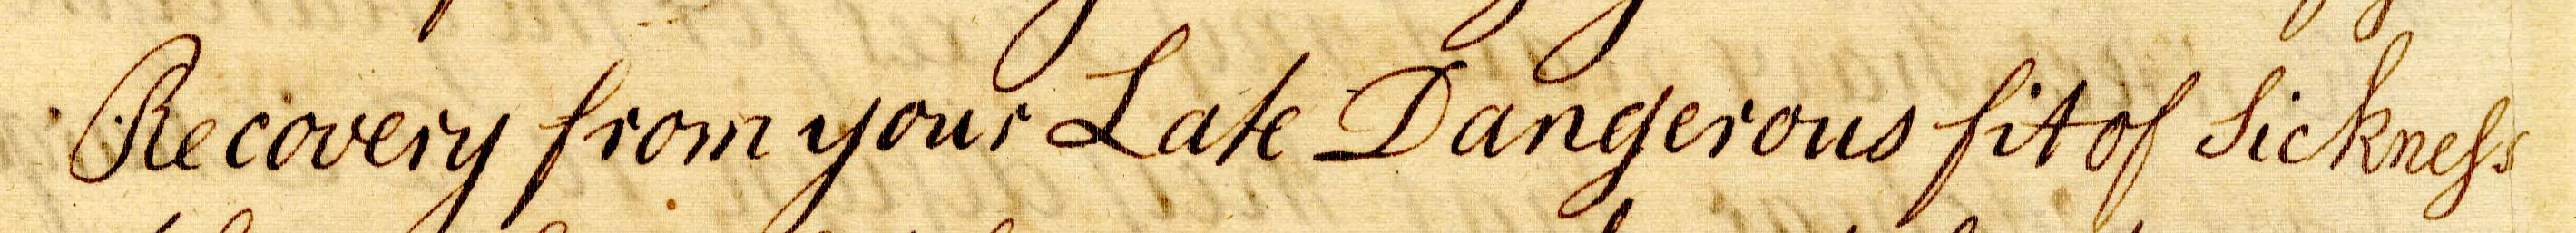Recovery from your Late Dangerous fit of Sickness
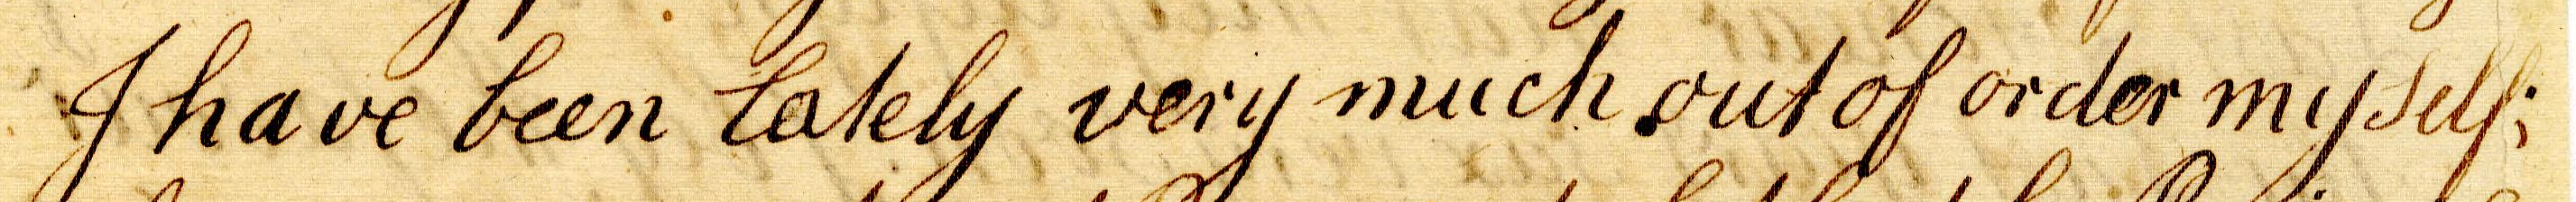I have been lately very much out of order myself;
